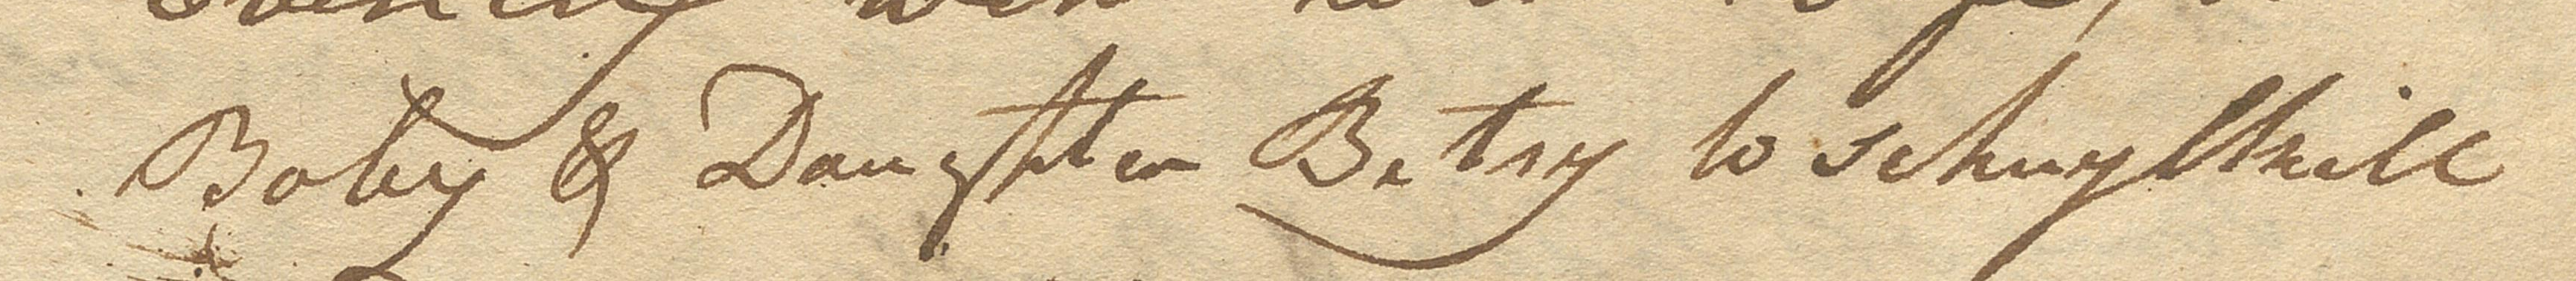Bobey & Daughter Betsy to schuylkill
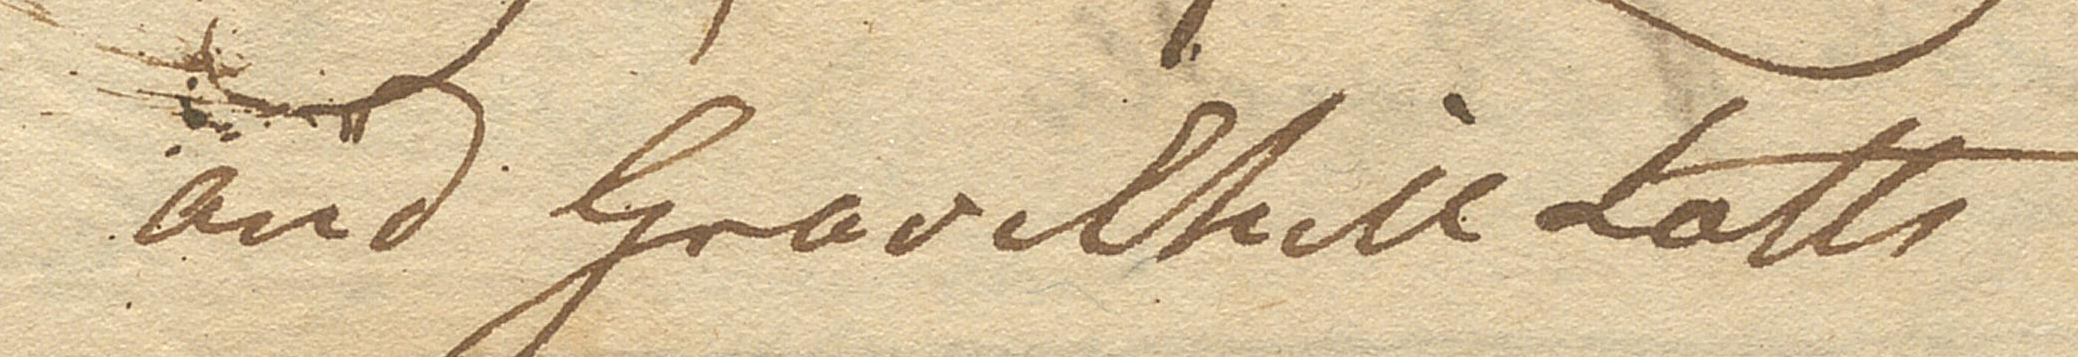and Gravelhill Lotts
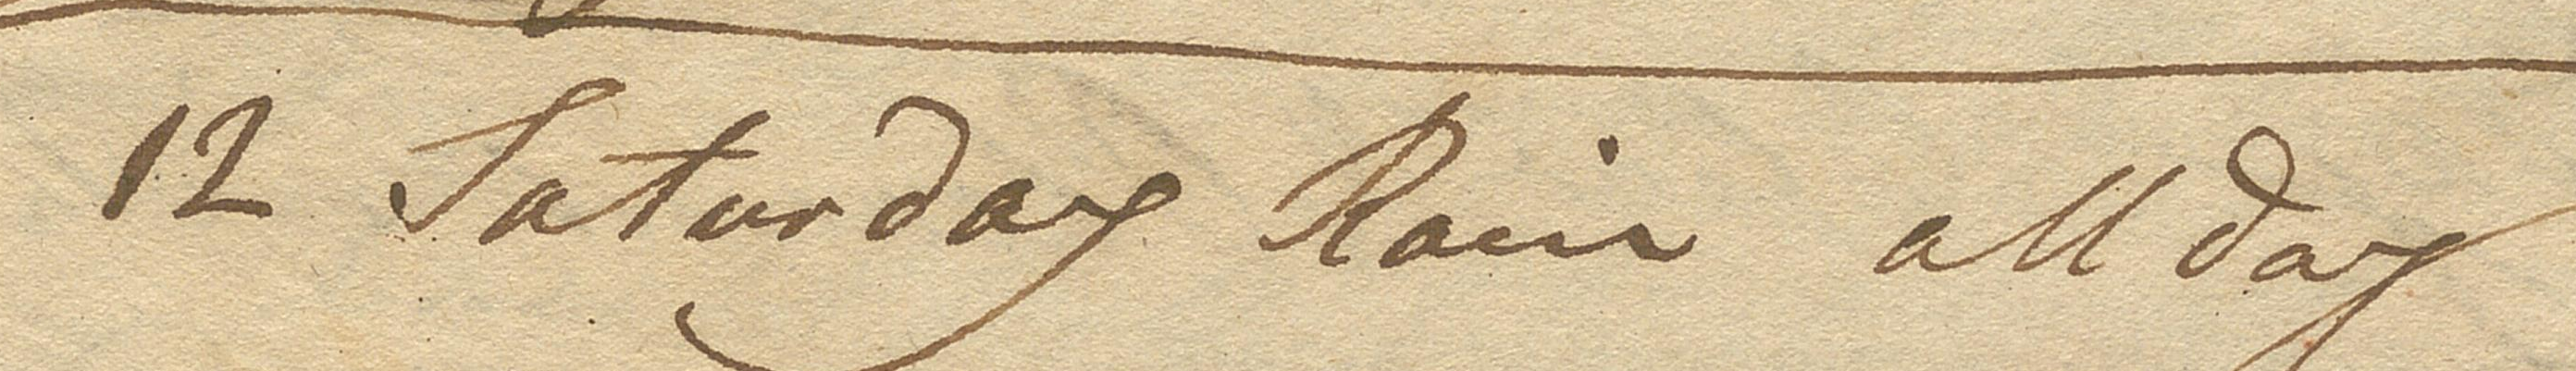12 Saturday Rain all day
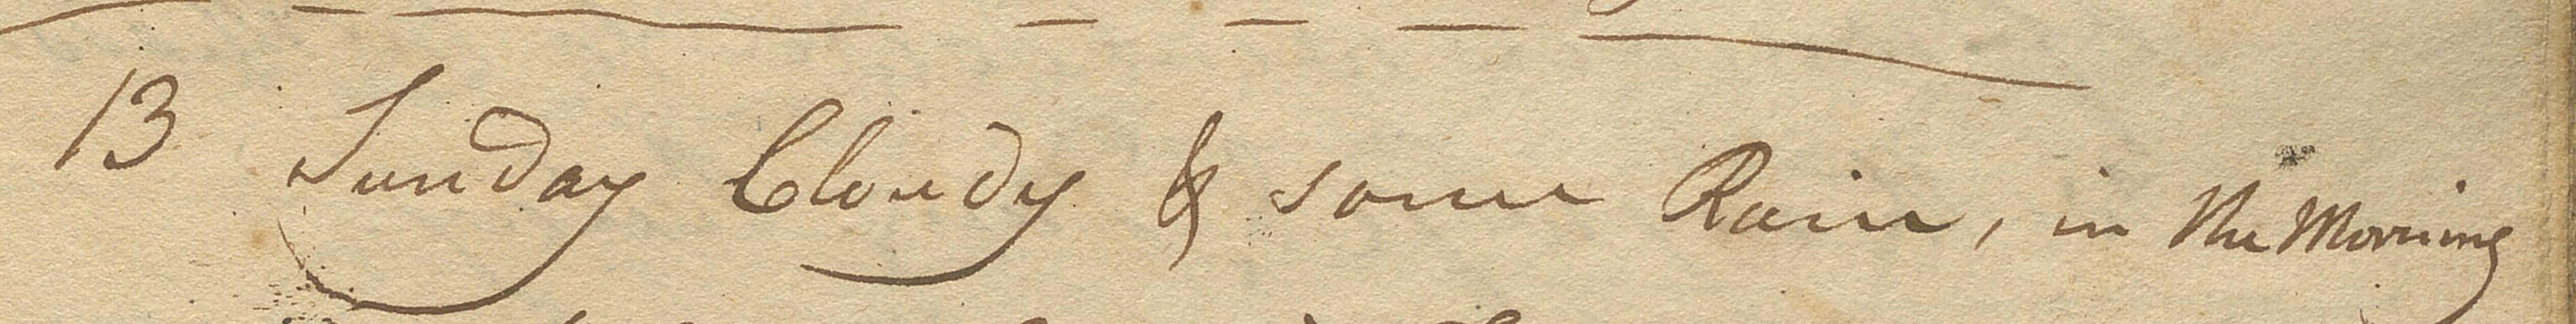13 Sunday Cloudy & some Rain, in the Morning
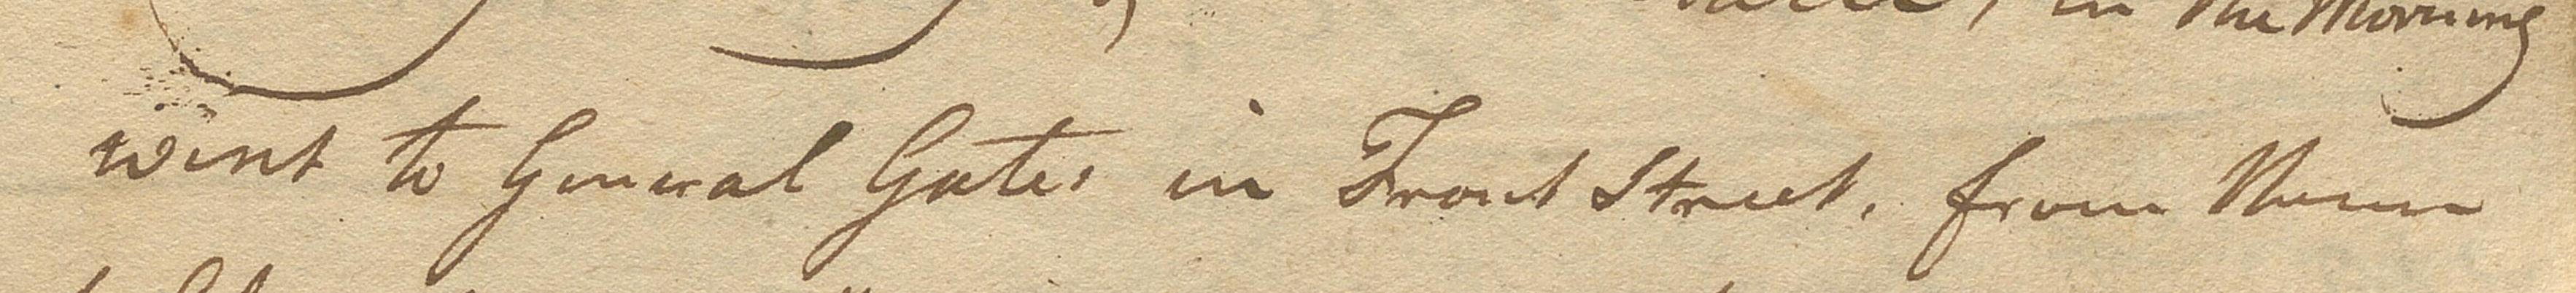went to General Gates in Front Street, from thence
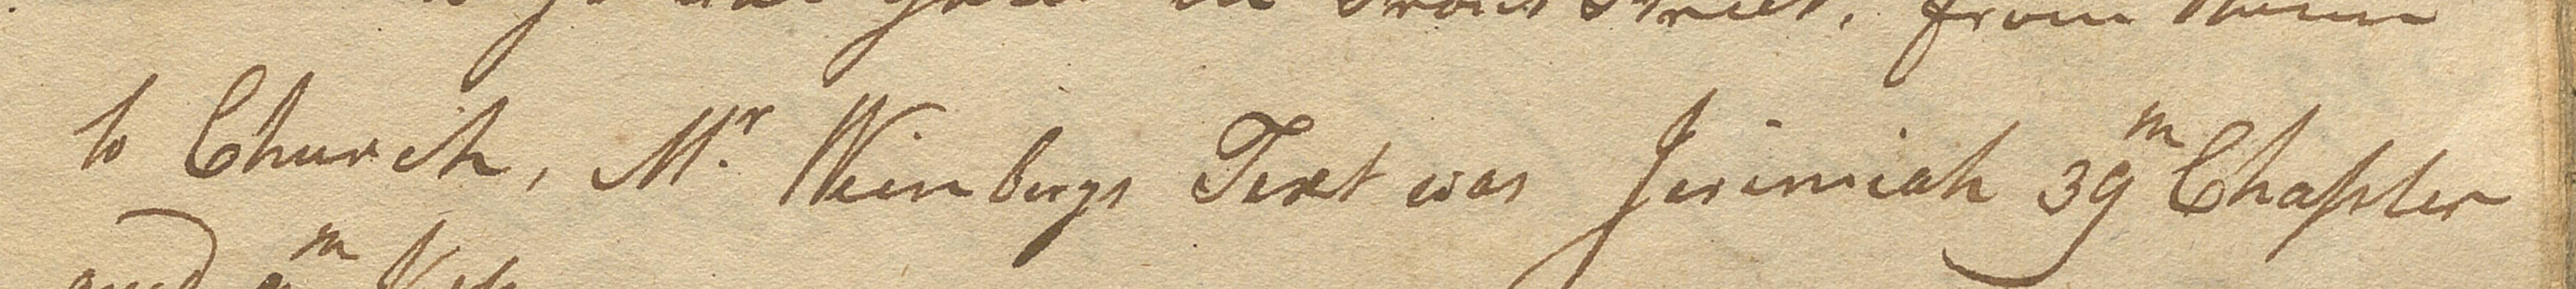to Church, M^r. Weinburgs Text was Jerimiah 39^th. Chapter
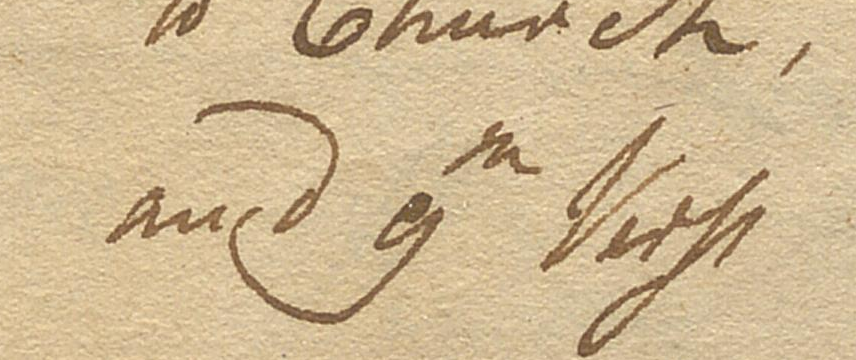and 9^th Verss
